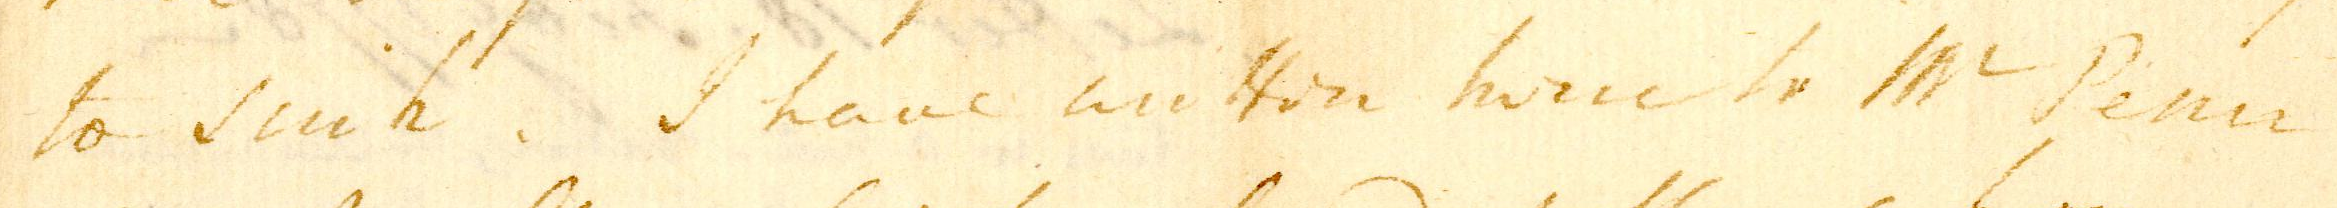to sink. I have written here to M^r Penn
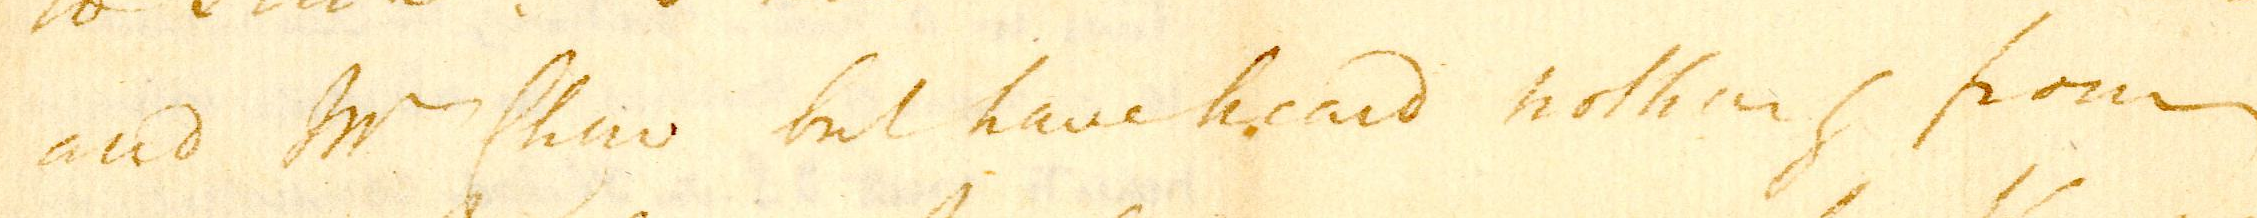and M^r Chew but have heard nothing from
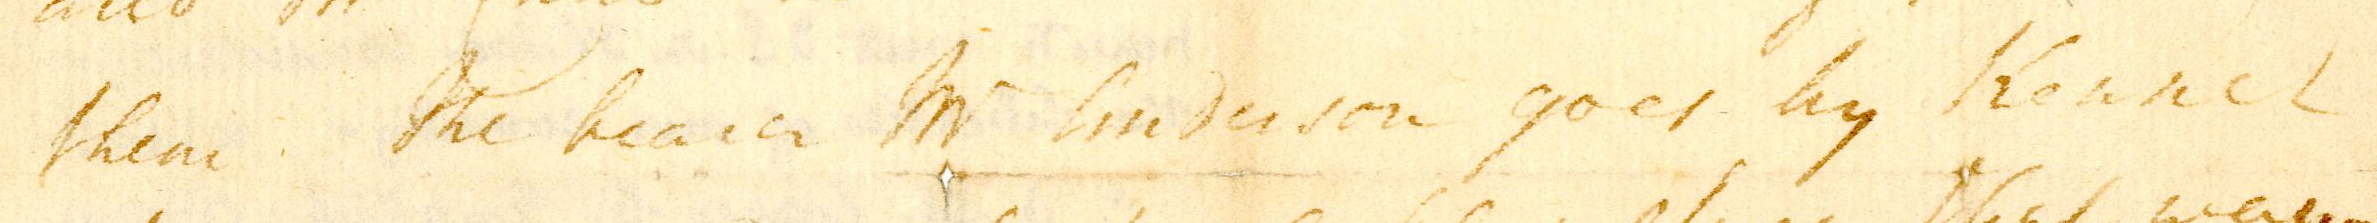them. The bearer M^r Anderson goes by Kennet
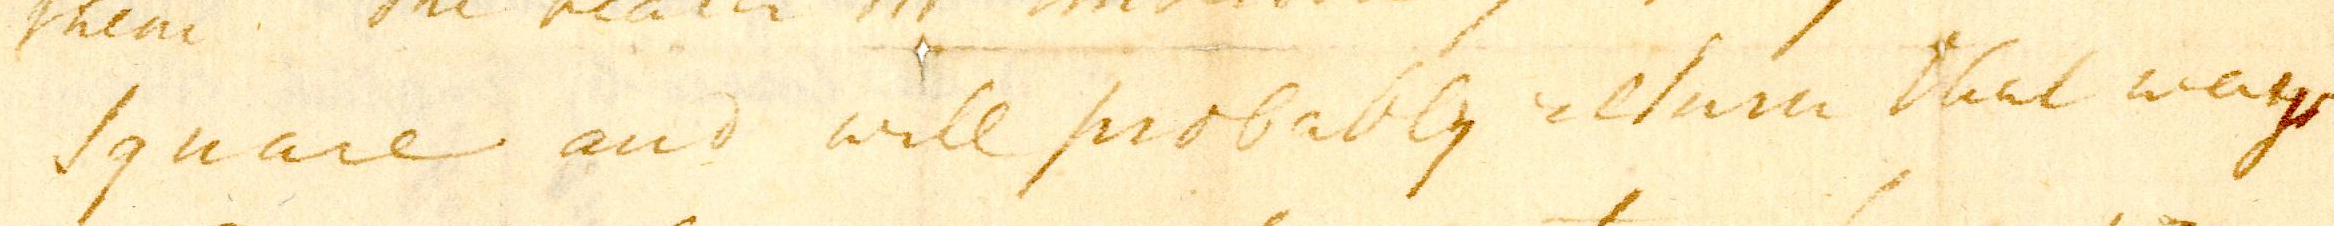Square and will probably return that way
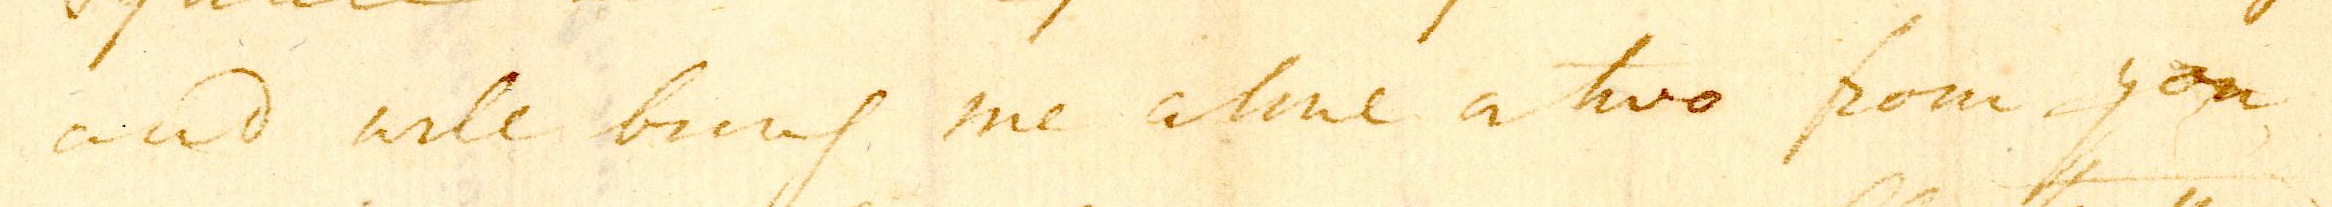and will brief me aline or two from you
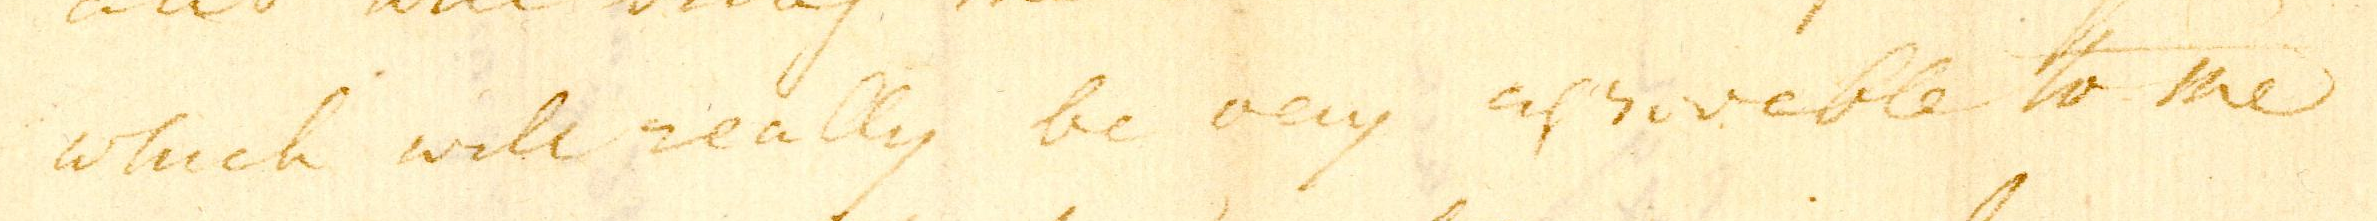which will really be very agreeable to the
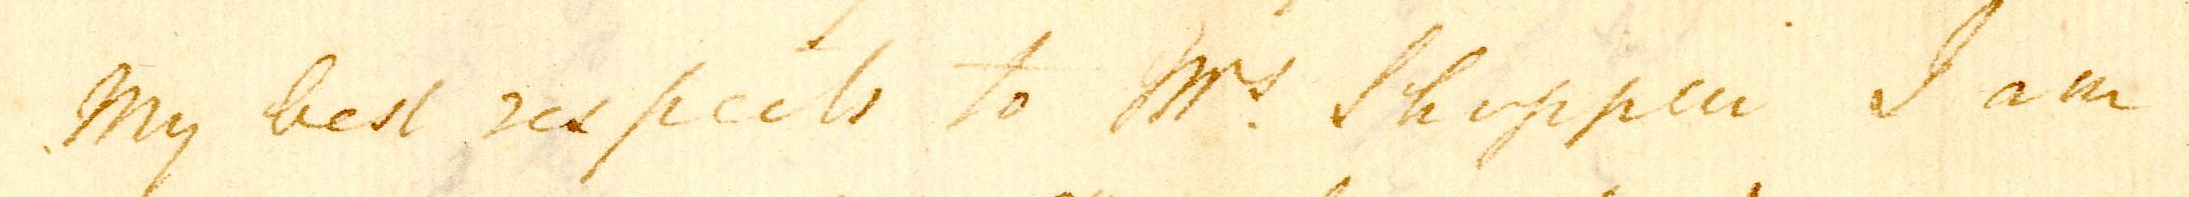My best respects to M^rs. Shippen I am
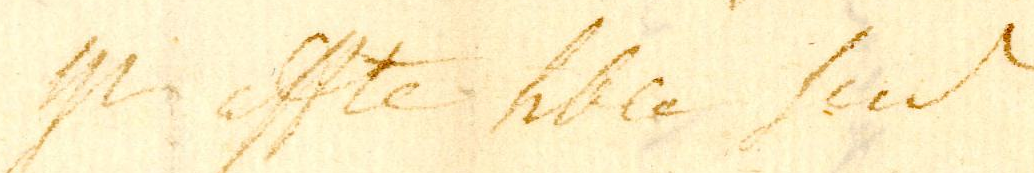yr affte hble serv^t
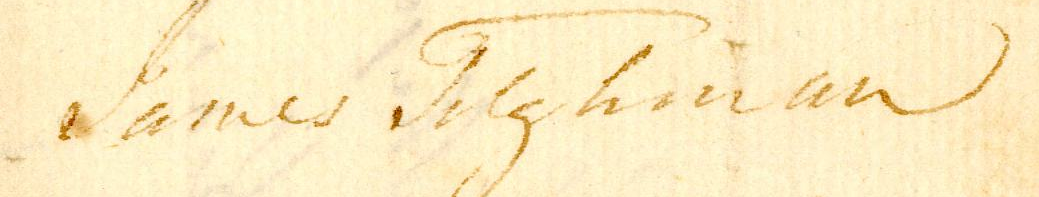James Tilghman
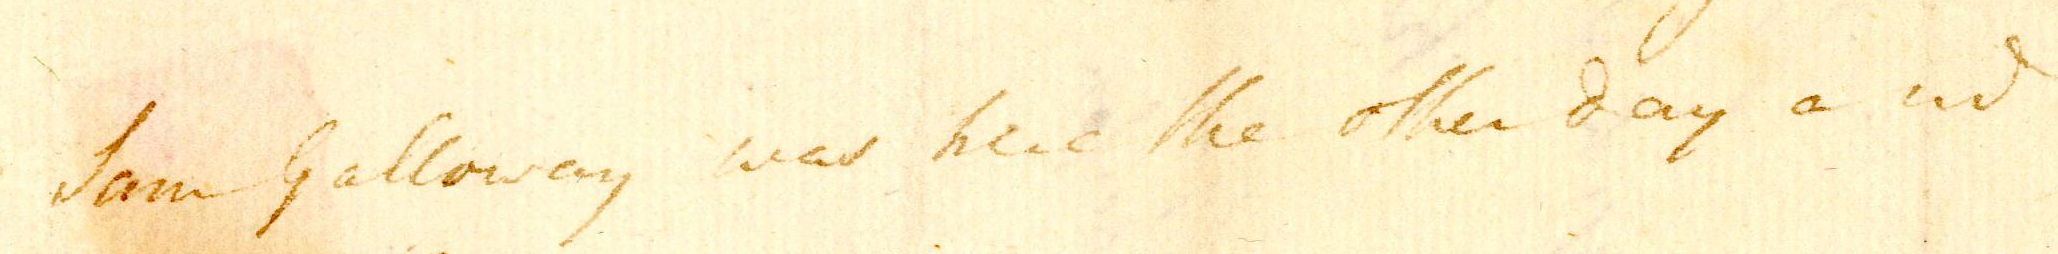Sam Galloway was here the other day and
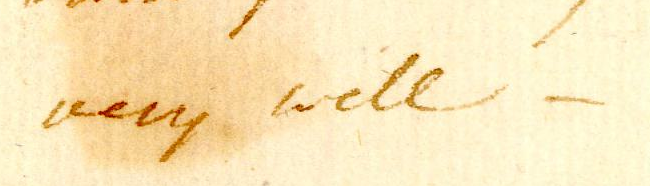very well-
